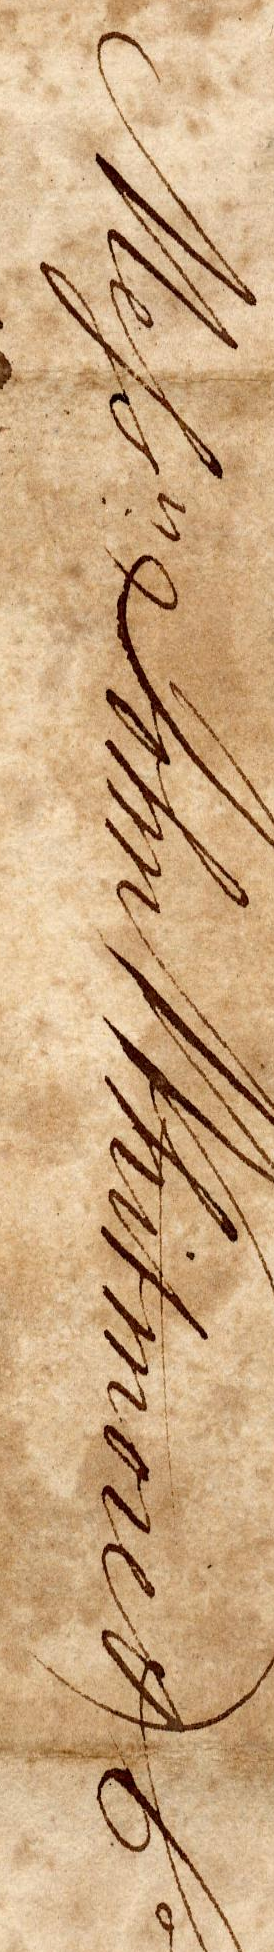Mess^rs. John Whitmore & C^o
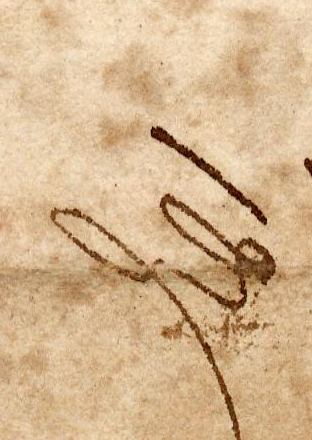10z
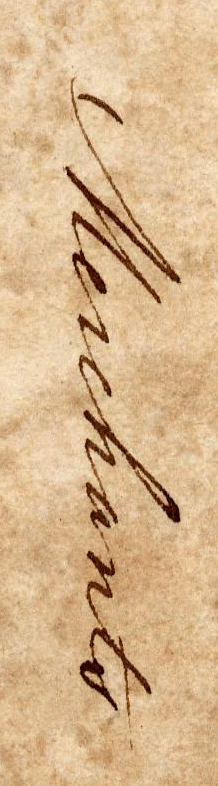Merchants
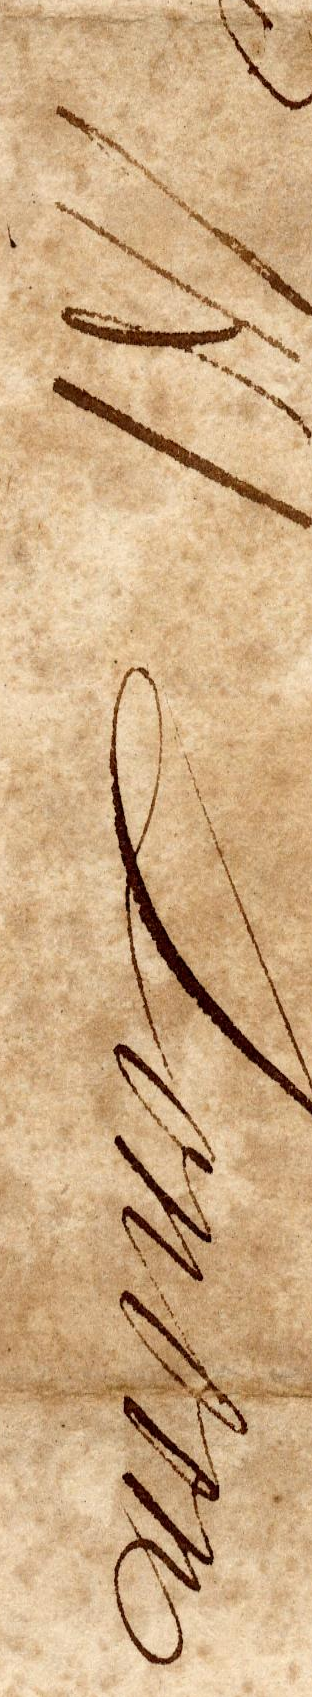IN London
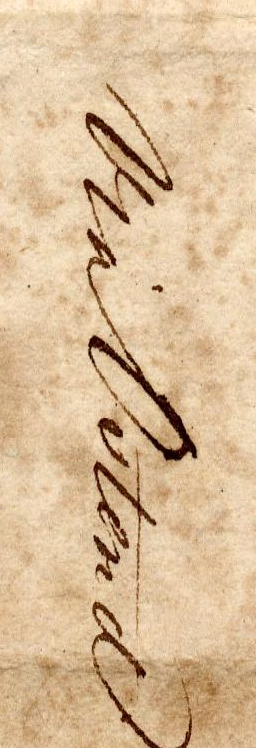Via Ostend
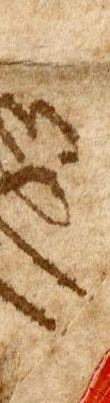1783
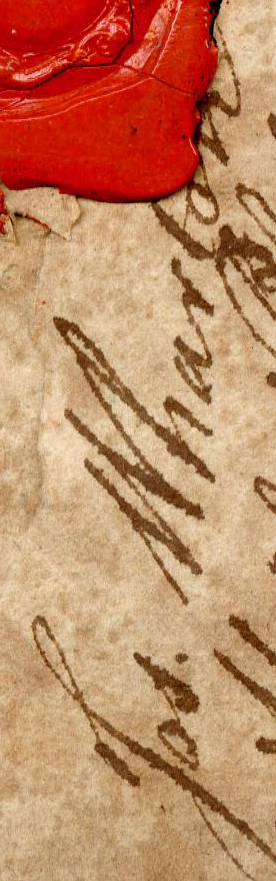Jos. Wharton
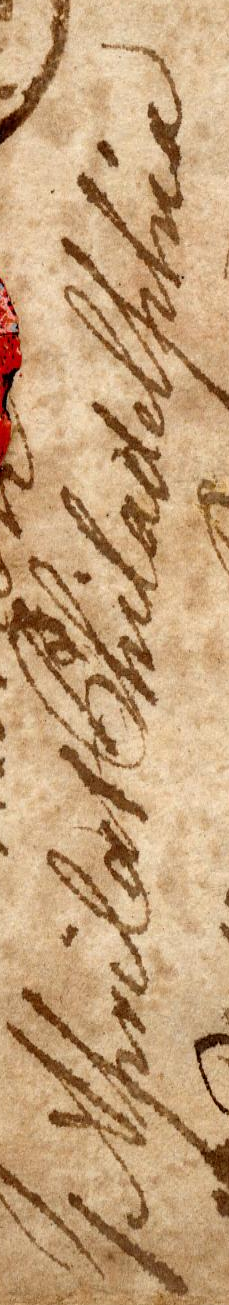1 April at Philadelphia
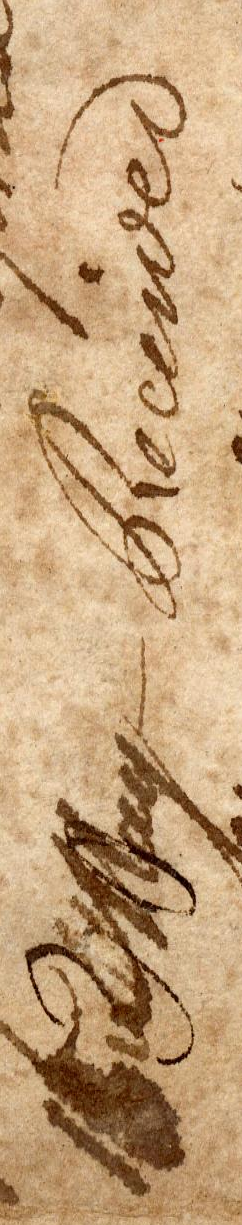30 May Received
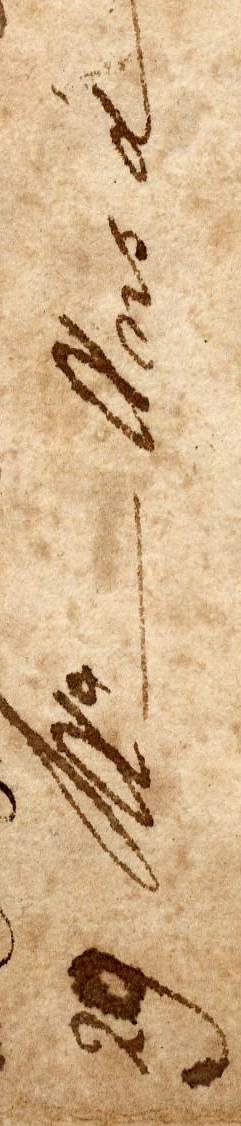29 d^o Ans'd
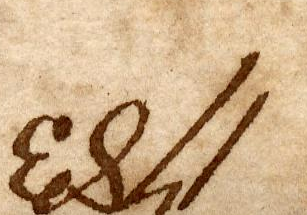1783
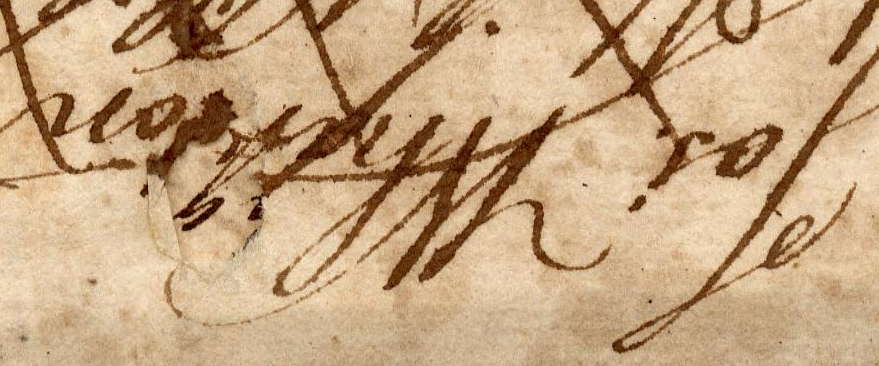Jos Wharton
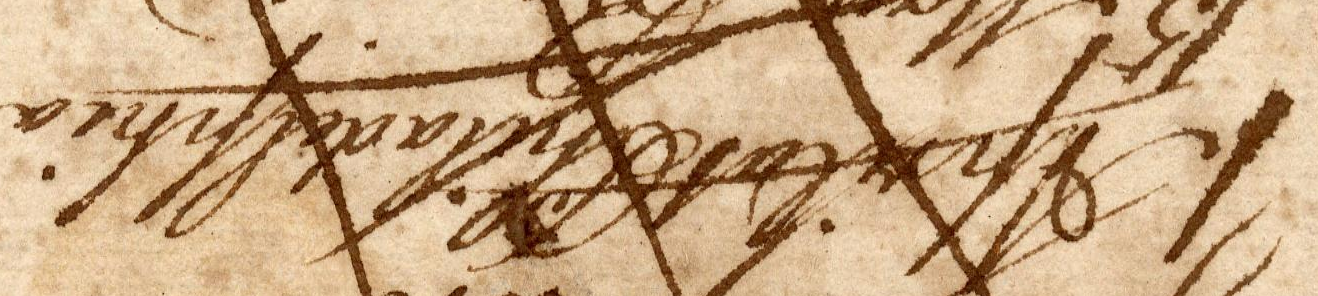[1 April at Philadelphia]
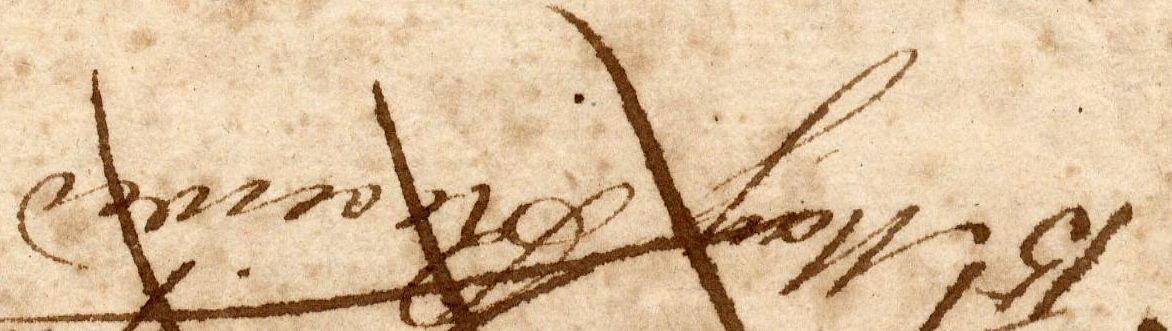[15 May Received]
